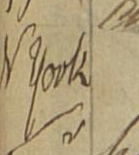N York
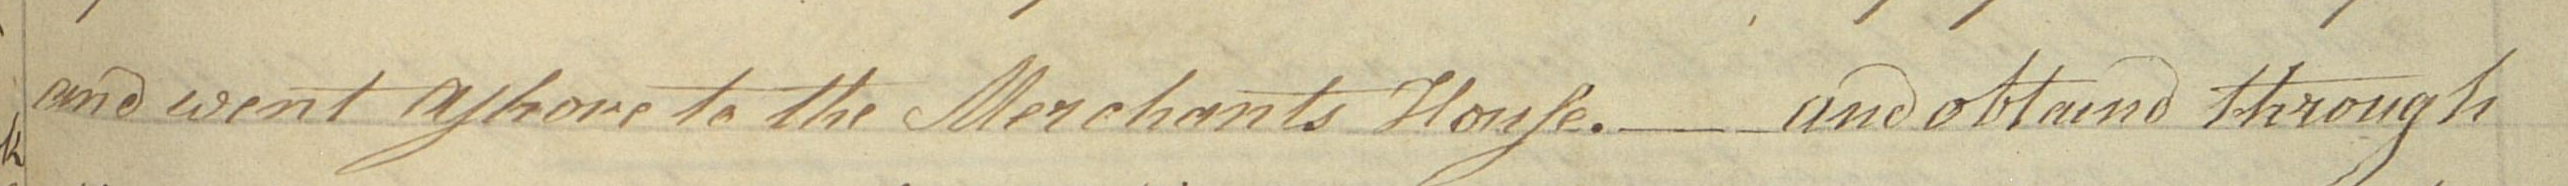and went ashore to the Merchants House. and obtaind through
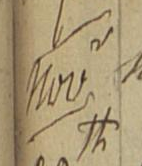Nov^r
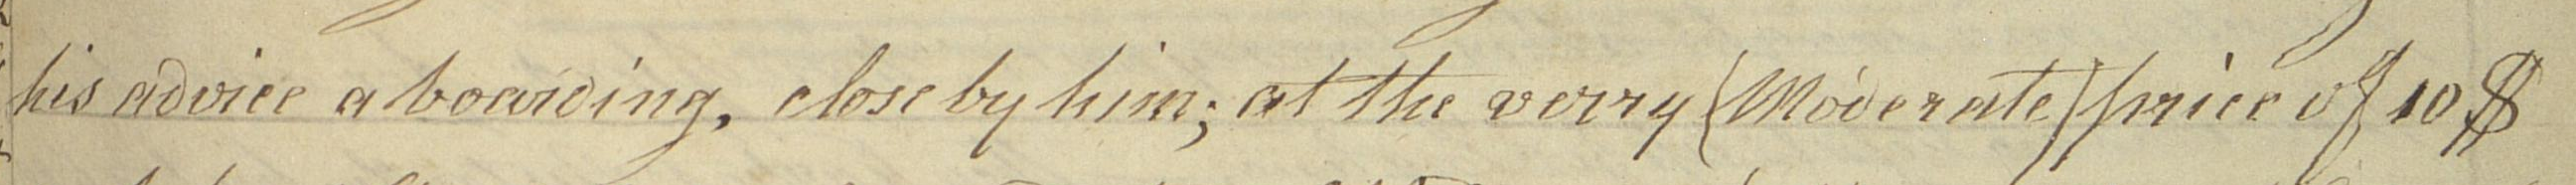his advice a boarding, close by him; at the verry (Moderate) price of 10 $
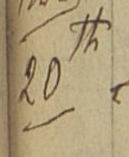20^th
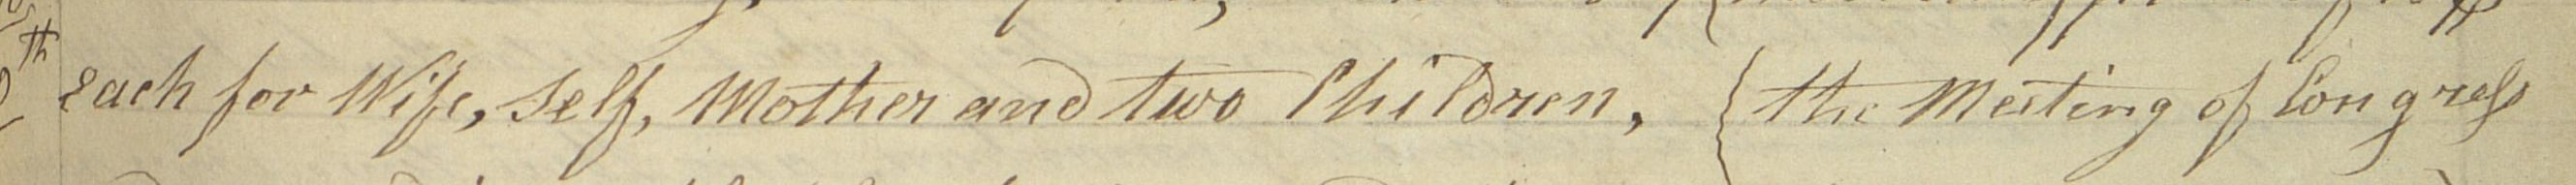each for Wise, Self, Mother and two Children, (the Meeting of Congress
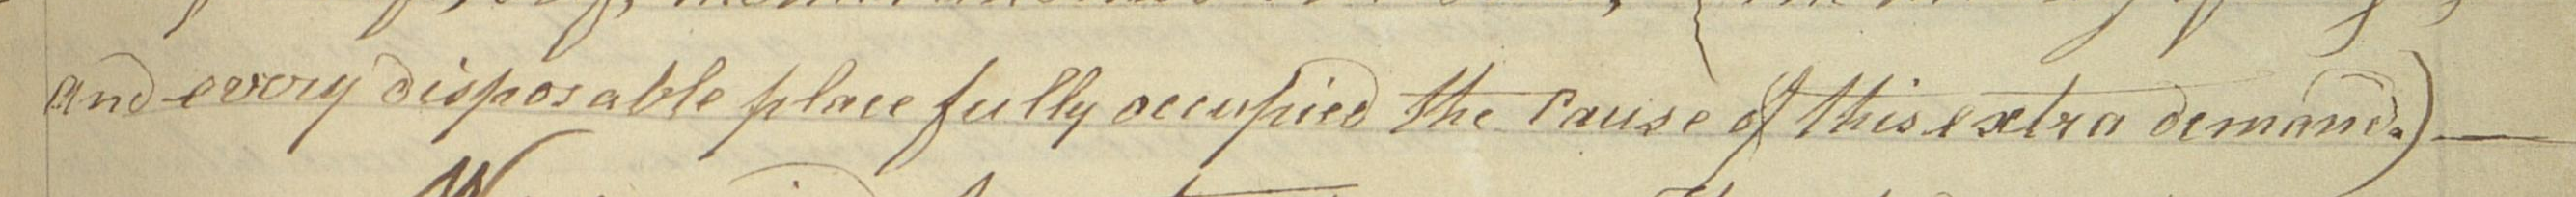and every disposable place fully occupied the cause of this extra demand.)
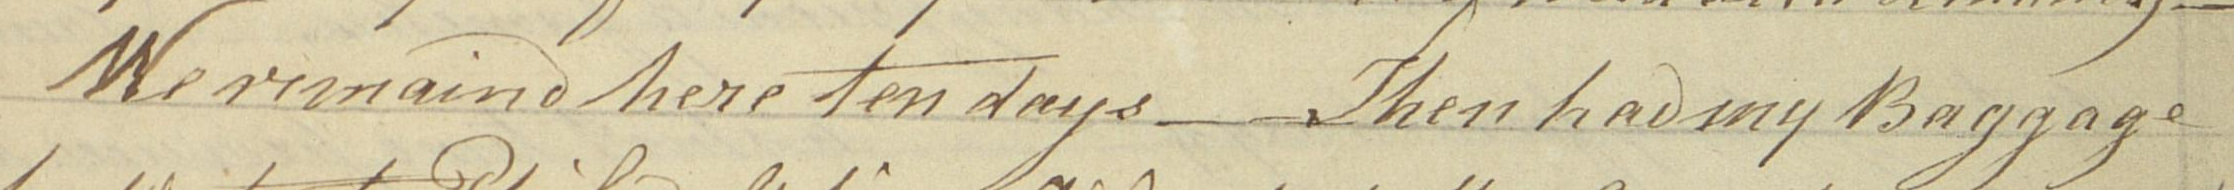We remaind here ten days Then had my Baggage
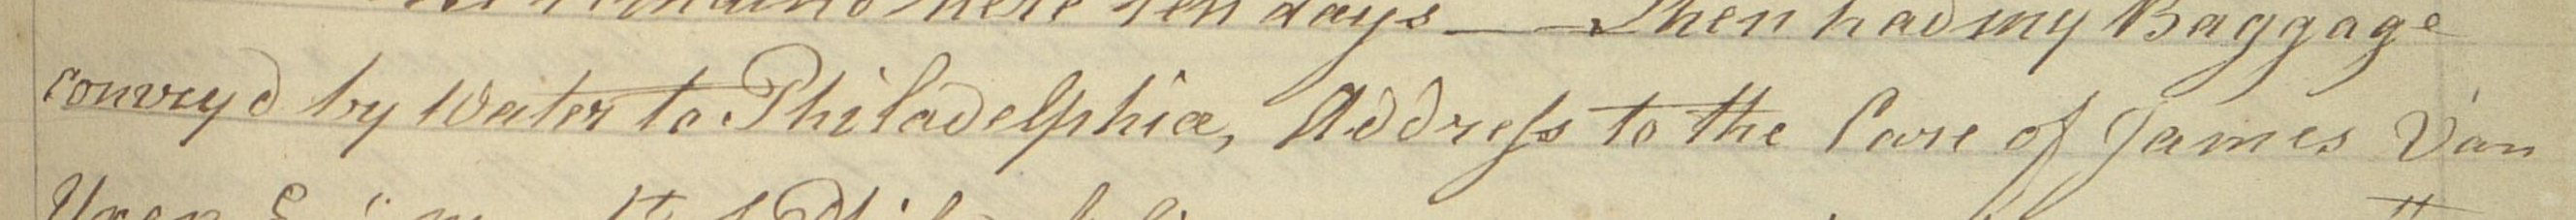conveyd by Water to Philadelphia, Address to the Care of James Van
